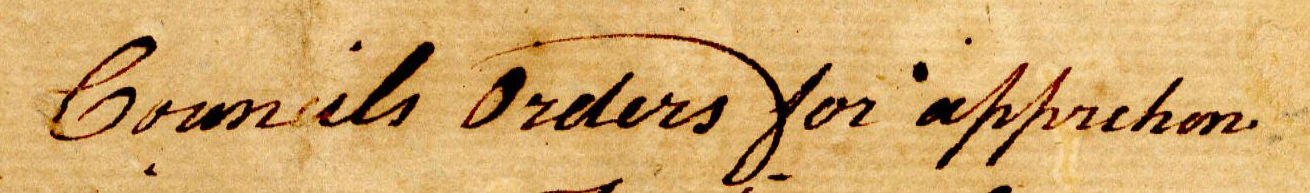Councils Orders for apprehen
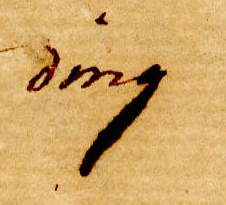ding
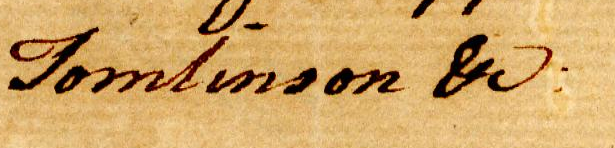Tomlinson &c:
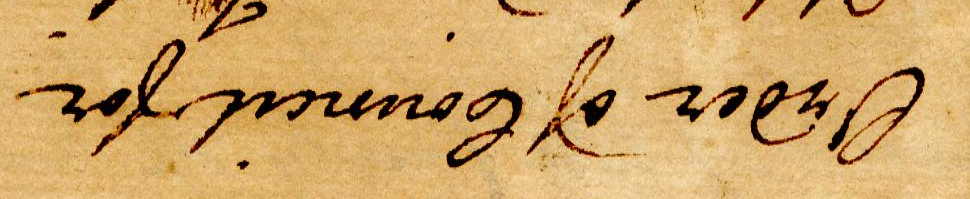Order of Council for
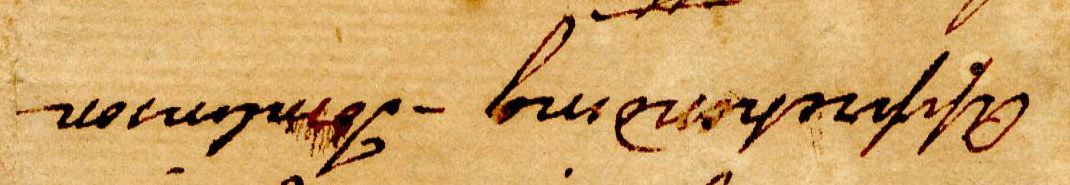apprehending- Tomlinson
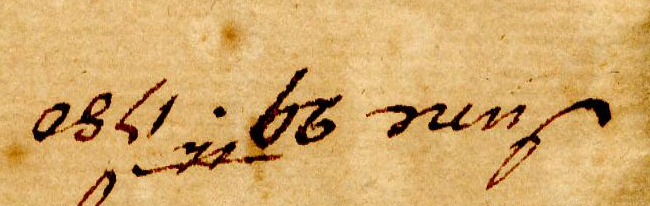June 29^th. 1780
